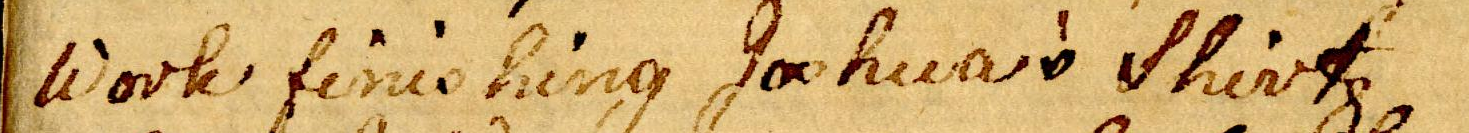Work finishing Joshua's Shirts
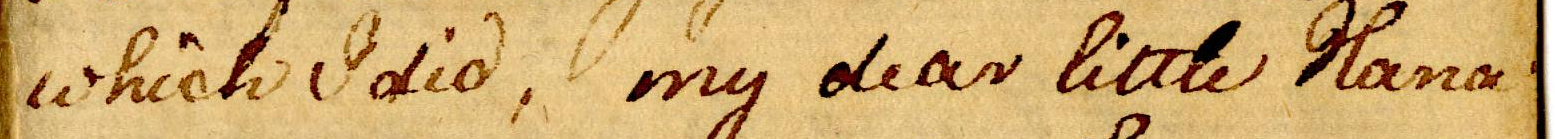which I did, my dear little Hana
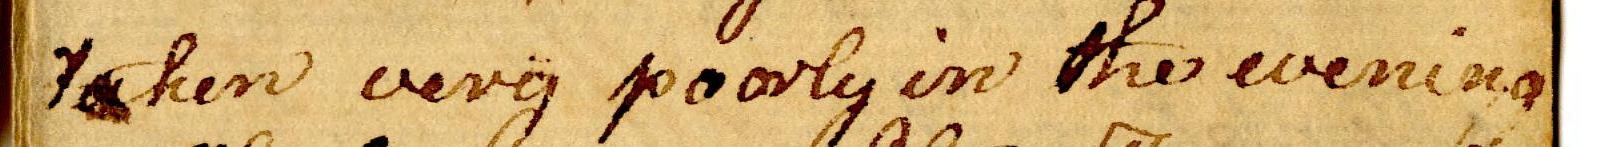taken very poorly in the evening
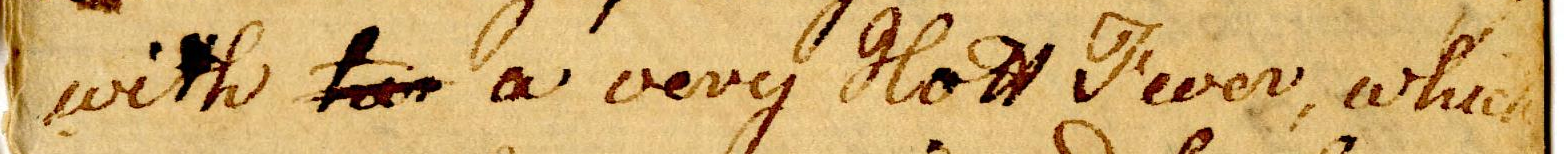with [___] a very Hott Fever, which
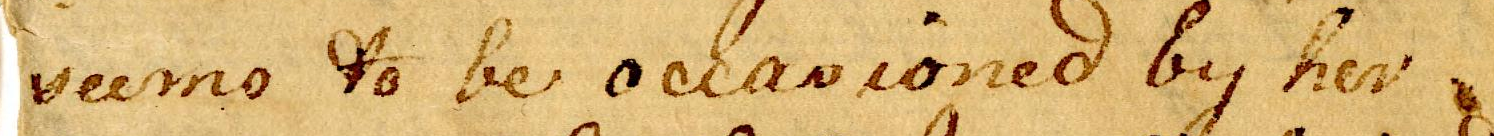seems to be occasioned by her
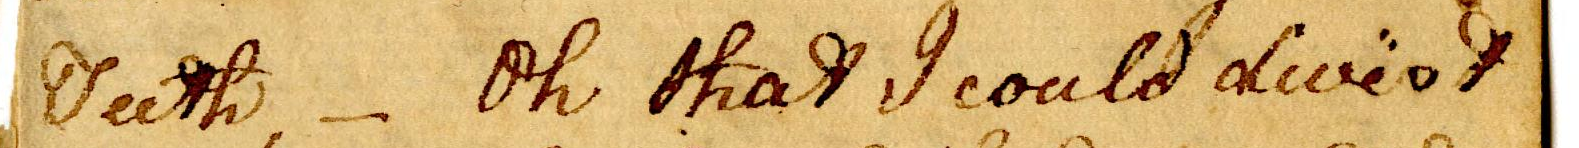Teeth- Oh that I could divest
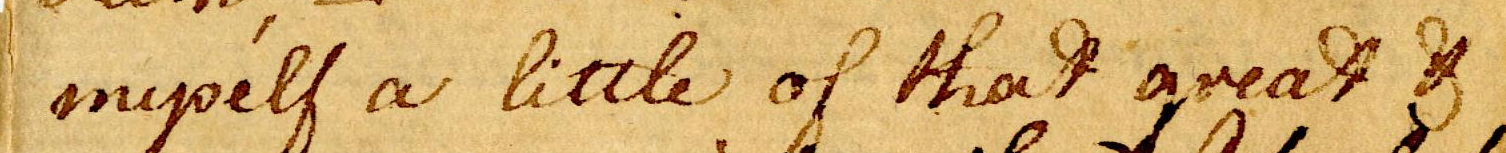myself a little of that great &
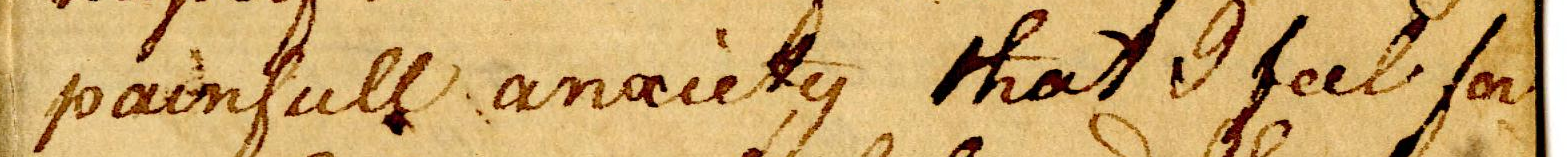painfull anxiety that I feel for
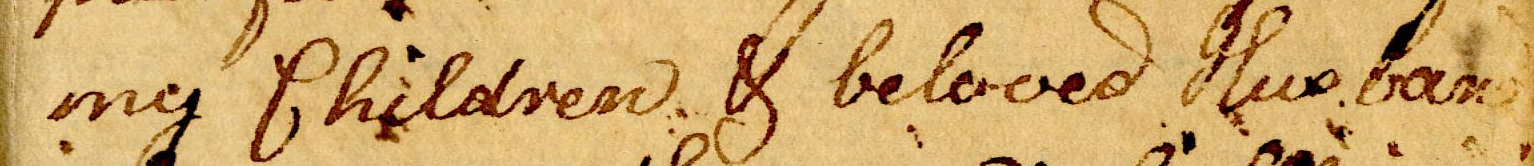my Children & beloved Husband
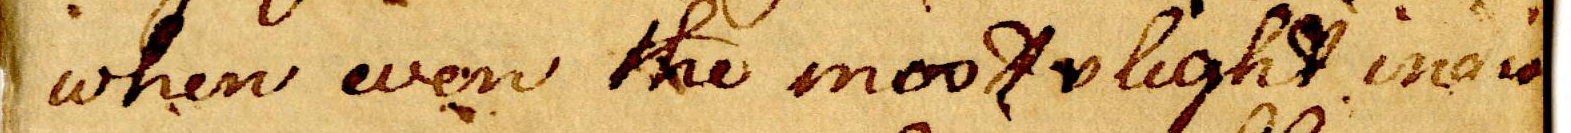when even the most slight indis
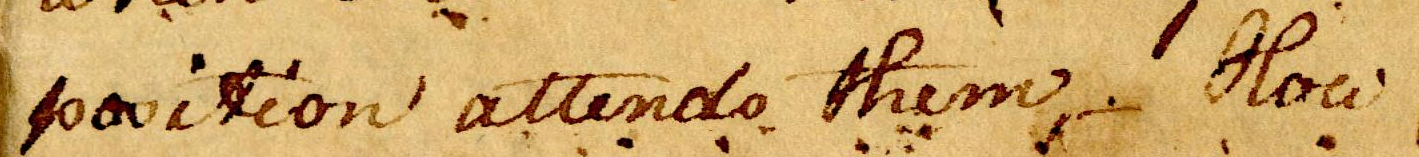position attends them- How
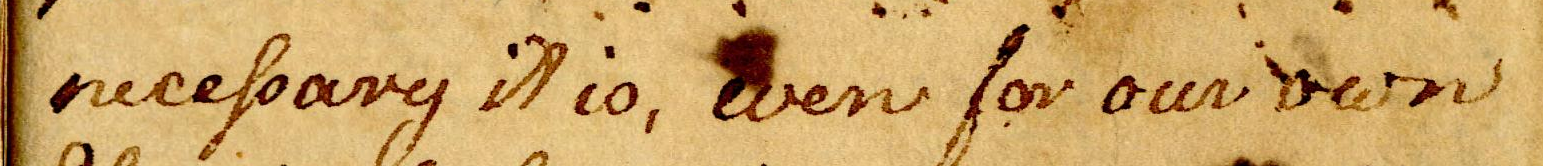necessary it is, even for our own
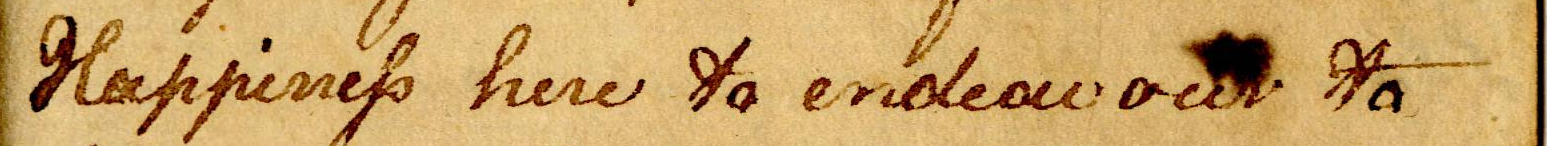Happiness here to endeavour to
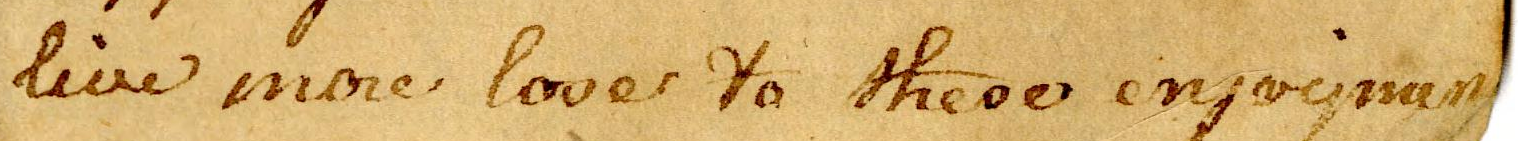live more lose to these enjoymen
